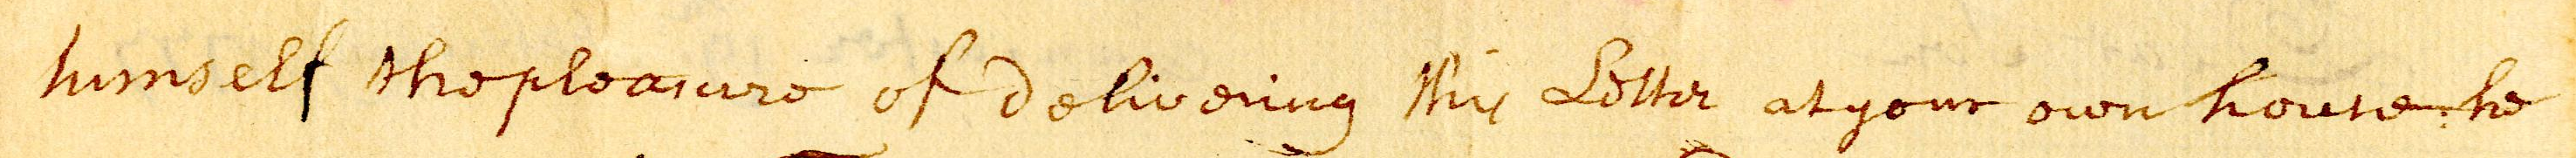himself the pleasure of delivering this Letter at your own house: he
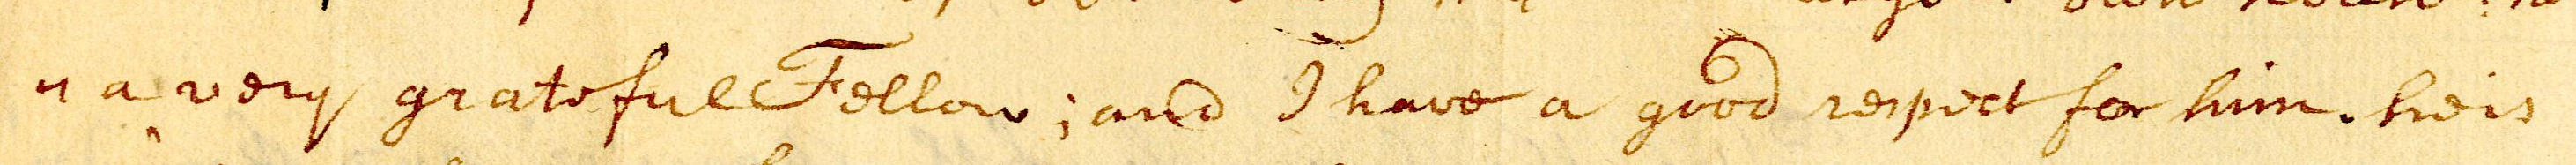is a very grateful Fellow; and I have a good respect for him. he is
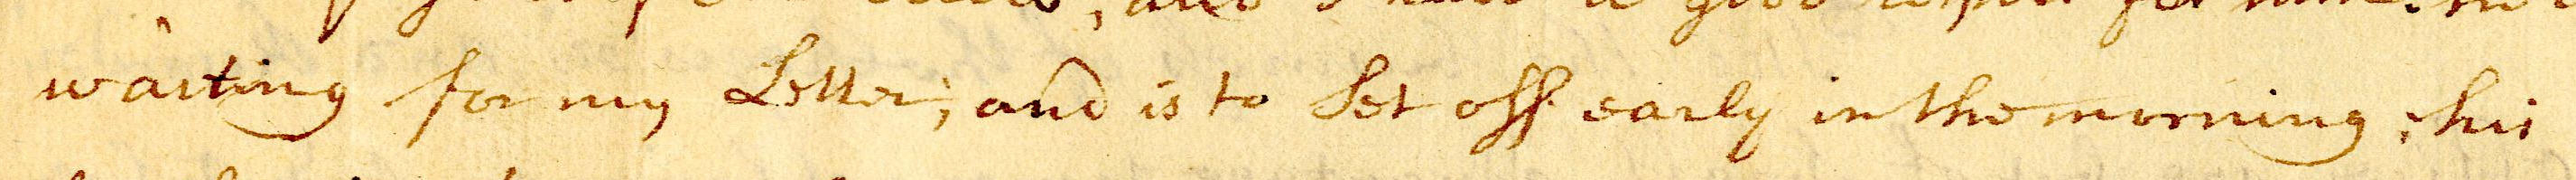waiting for my Letter; and is to Set off early in the morning; his
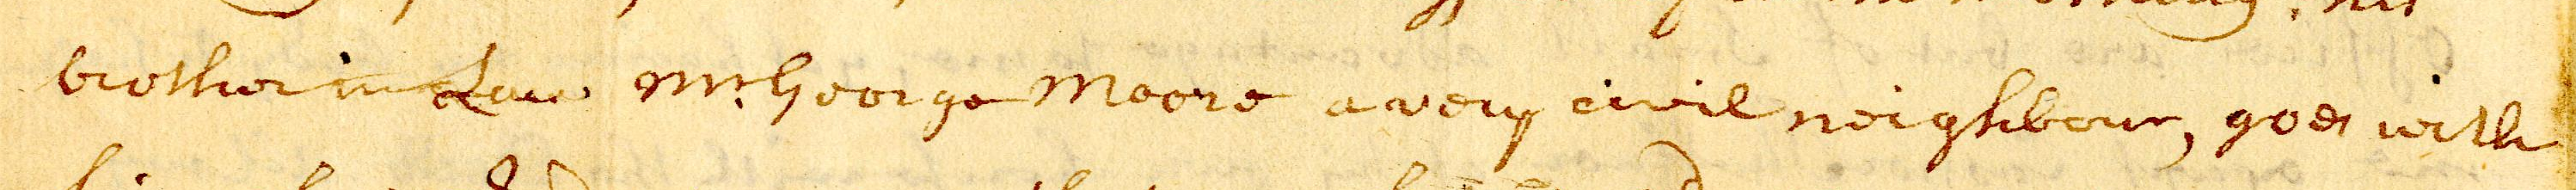brother in Law M^r. George Moore a very civil neighbour, goes with
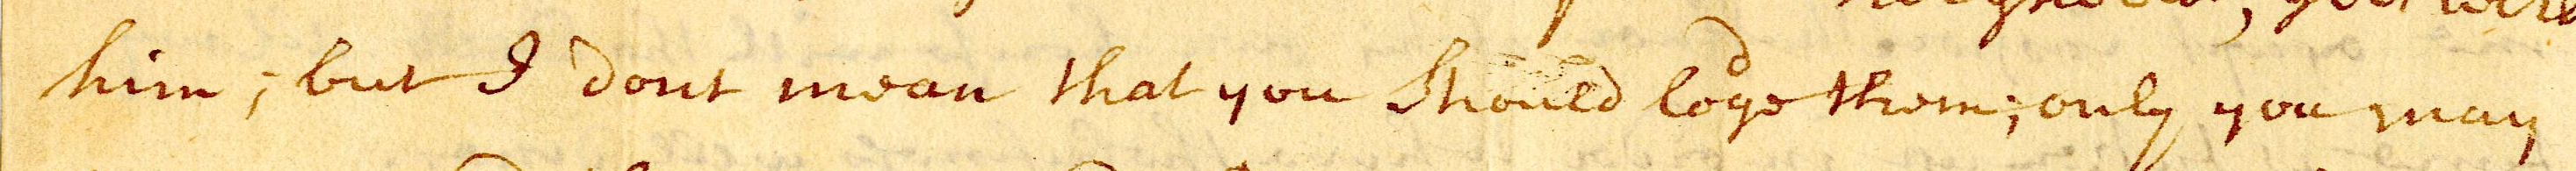him; but I dont mean that you should loge them, only you may
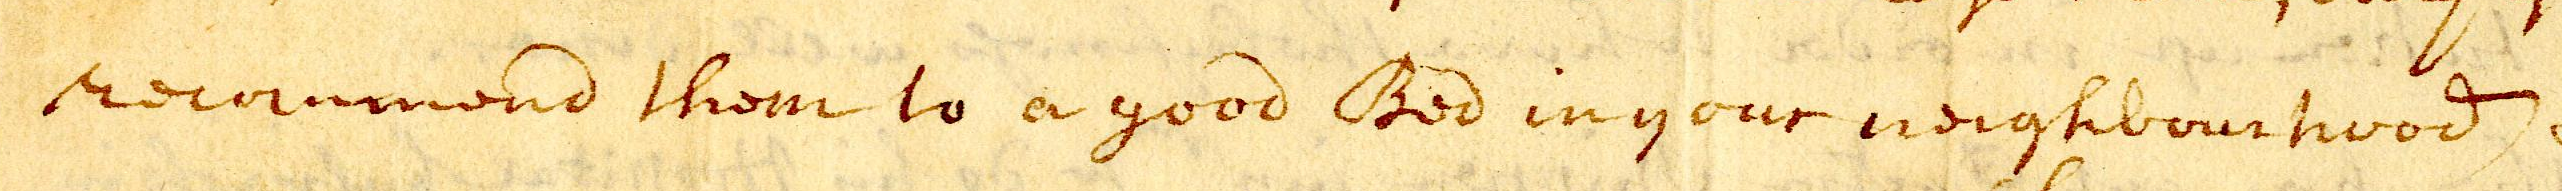recommend them to a good Bed in your neighborhood
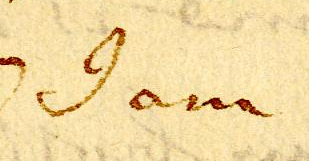I am
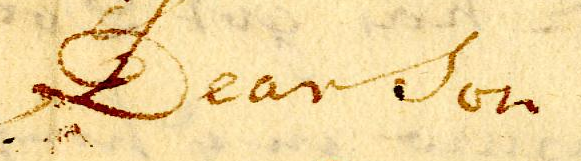Dear Son
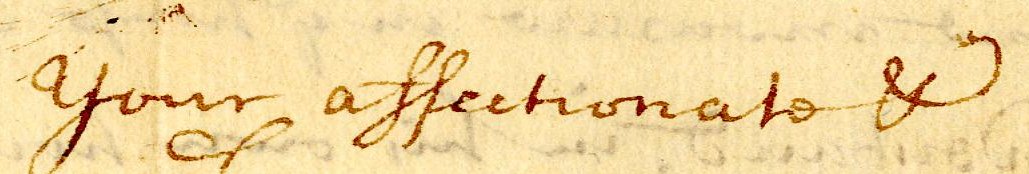Your affectionate &
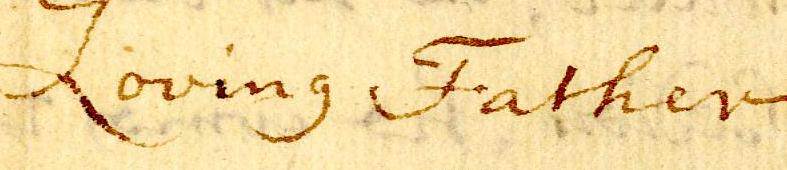Loving Father
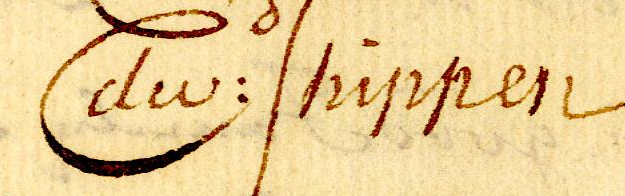Edw^d: Shippen
